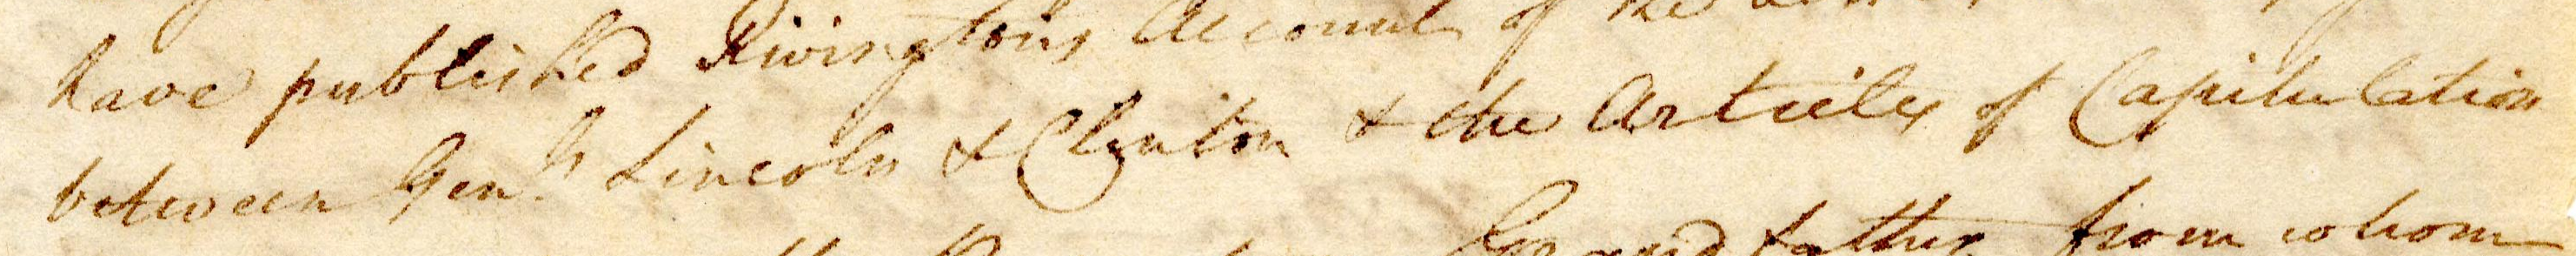between Gen^l. Lincoln & Clinton & the Articles of Capitulation
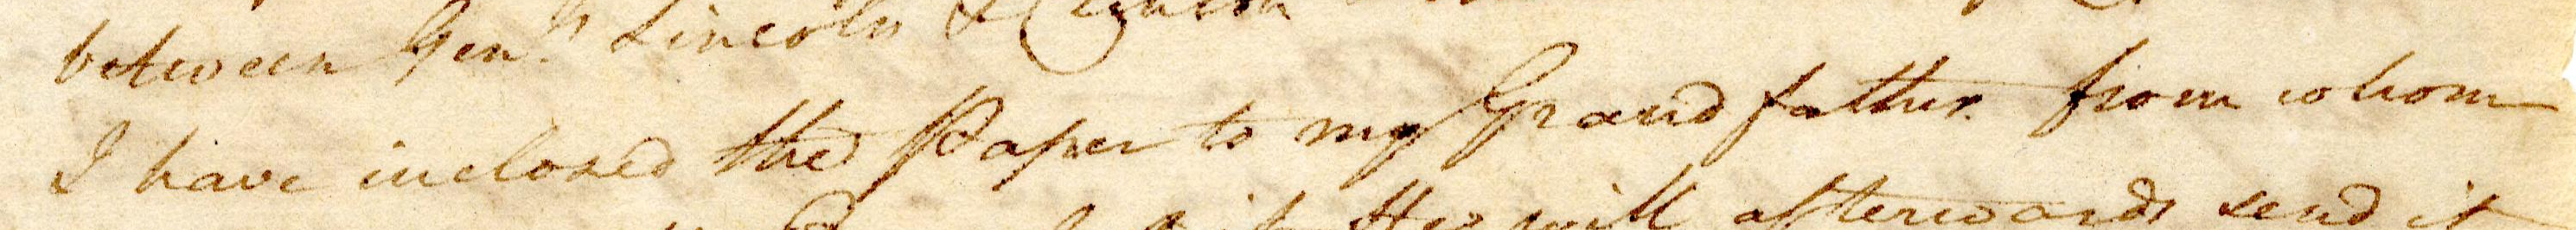I have inclosed the Paper to my Grand father from whom
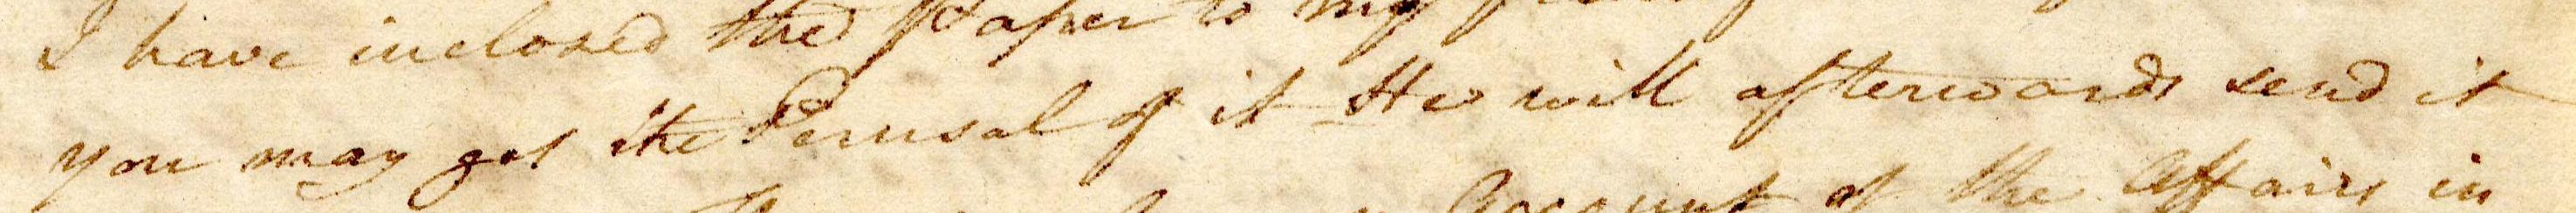you may get the Perusal of it He will afterwards send it
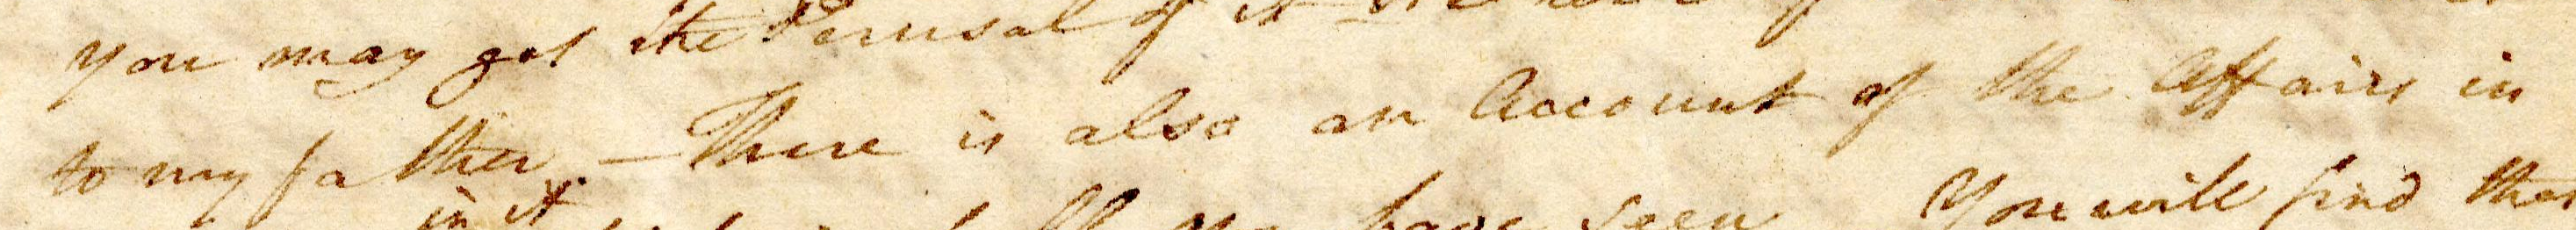to my father. There is also an Account of the Affairs in
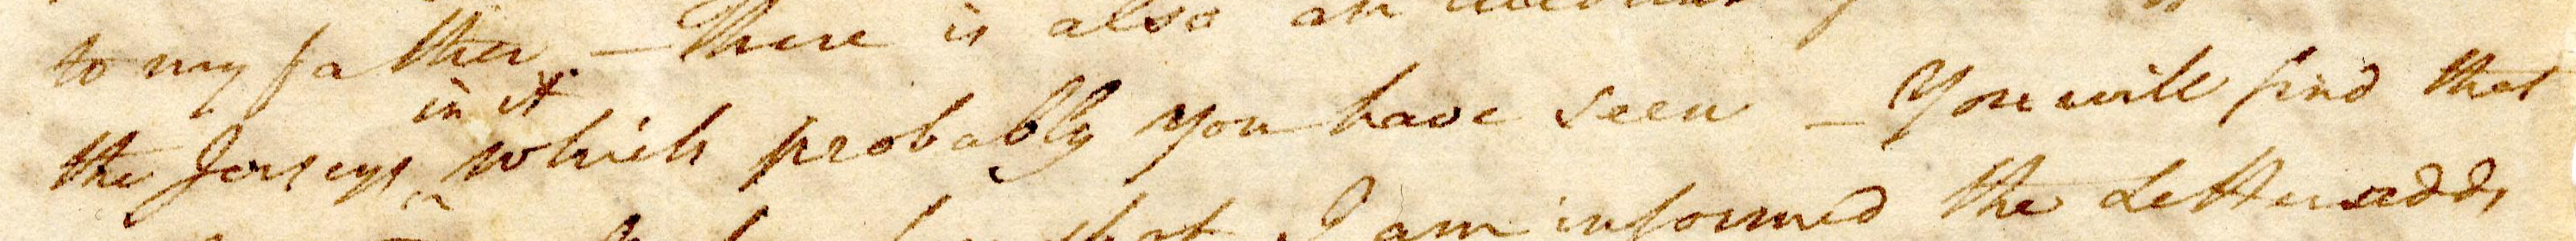the Jersey which probably you have seen. You will find that
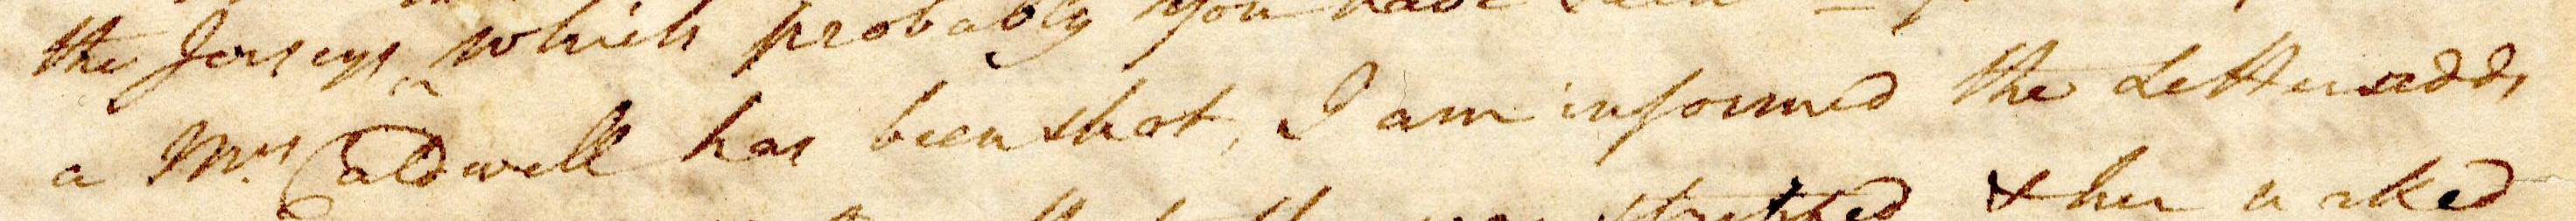a M^rs. Caldwell has been shot, I am informed the Letter adds
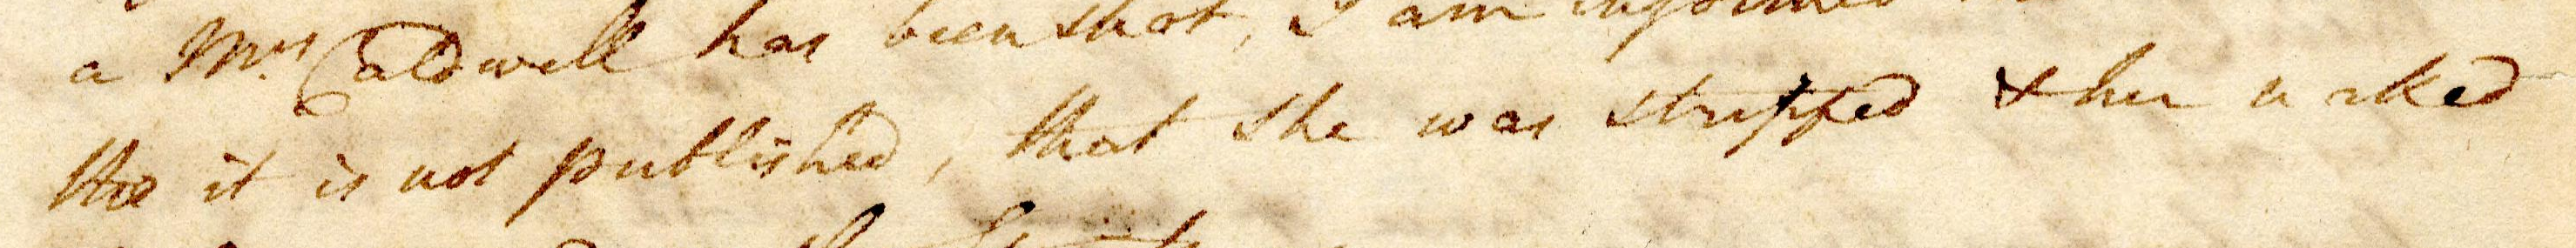the it is not published that she was stripped & her naked
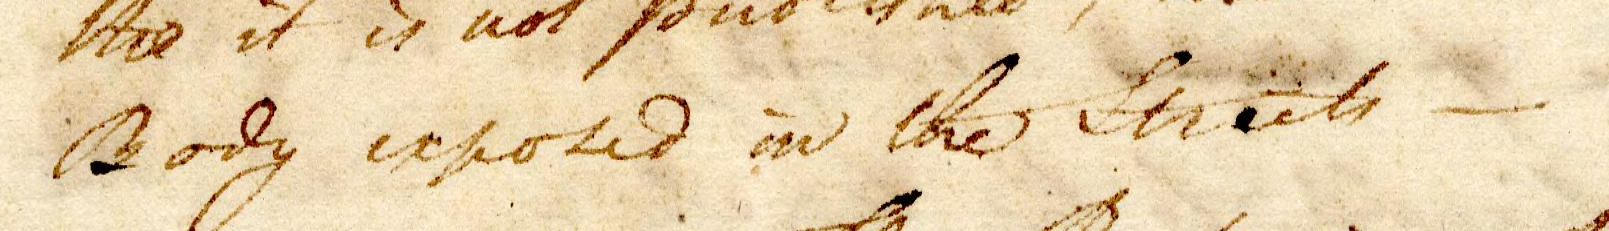Body exposed in the Streets.
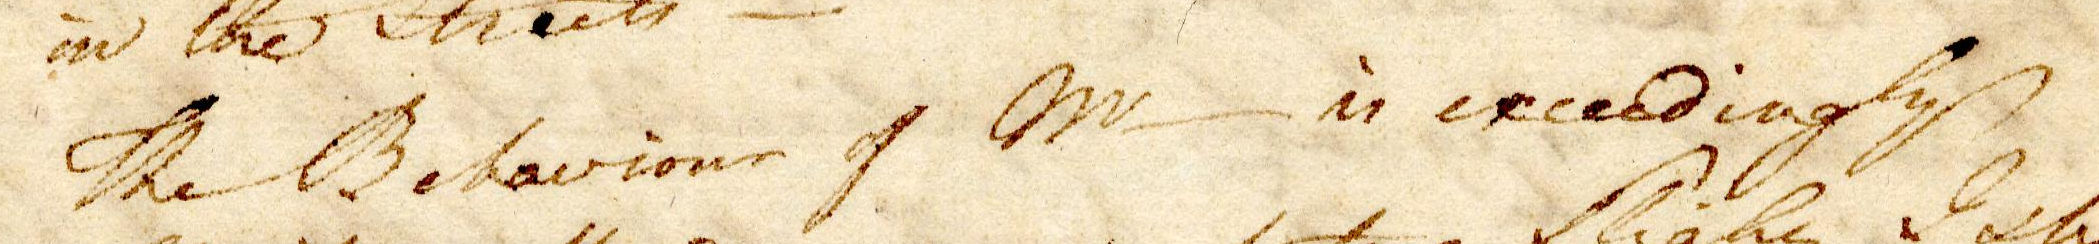The Behaviour of M- is exceedingly
